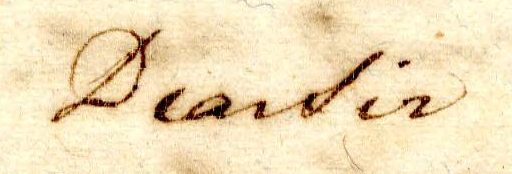Dear Sir
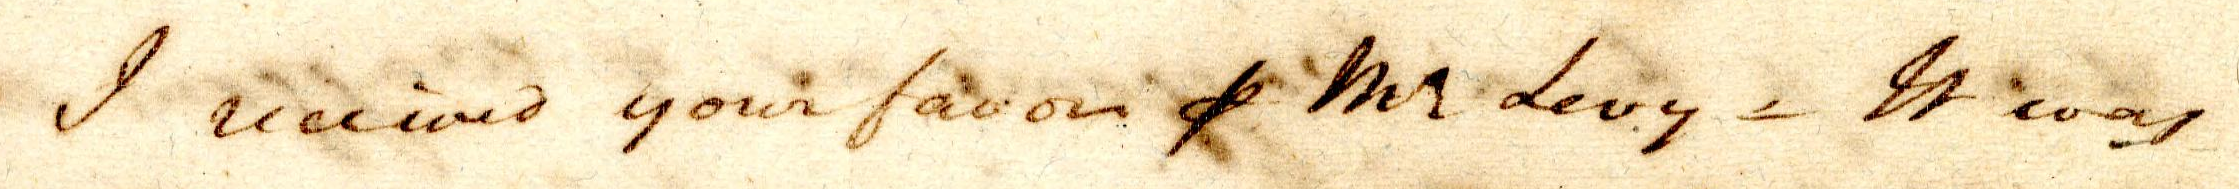I received your favor per M^r Levy. It was
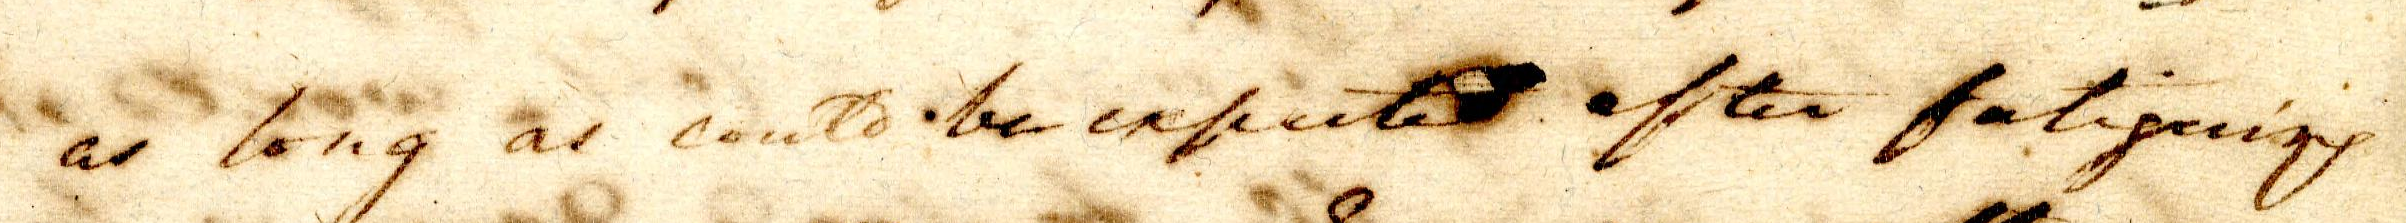as long as could be expected after fatiguing
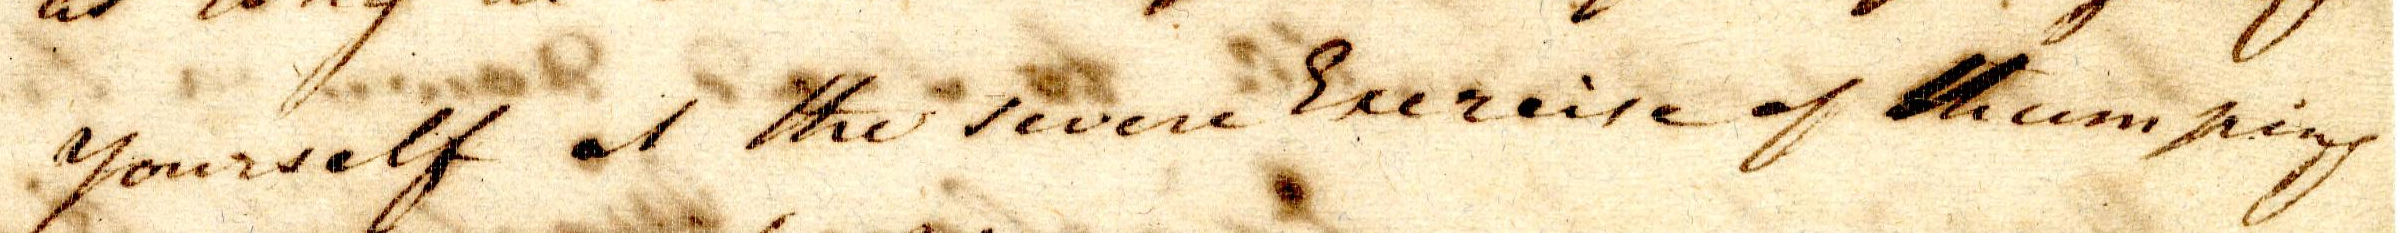yourself at the severe Exercise of thumping
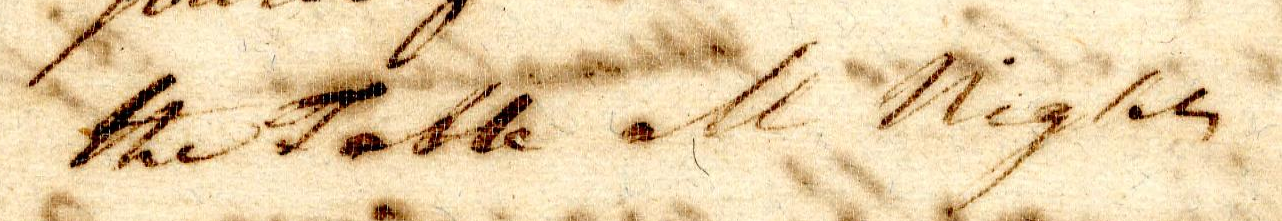the Table all Night
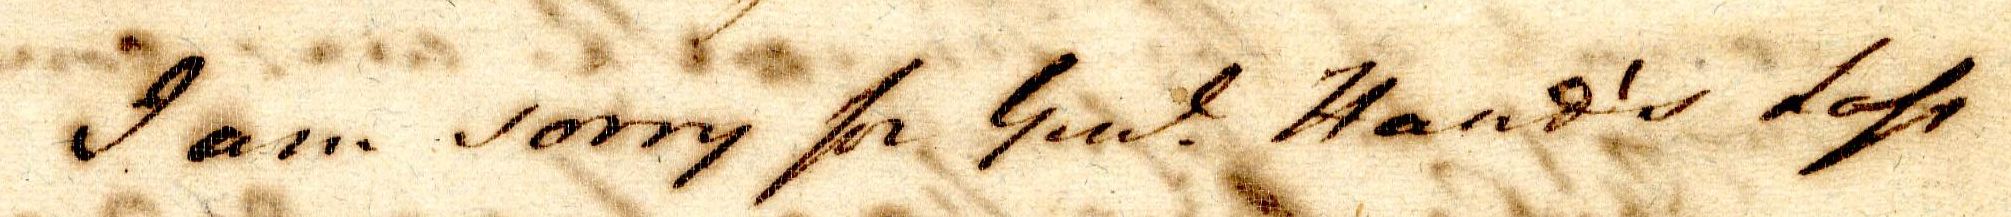I am sorry for Gen^l. Hand's Loss
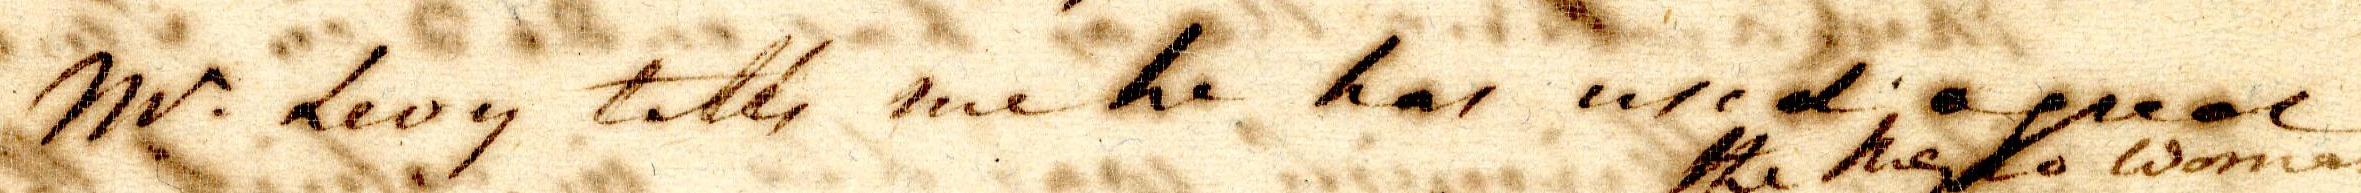M^r. Levy tells me he has used; a great
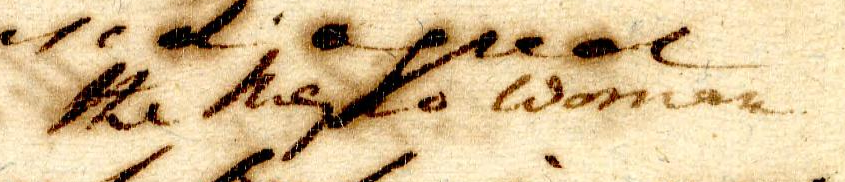the Negro woman
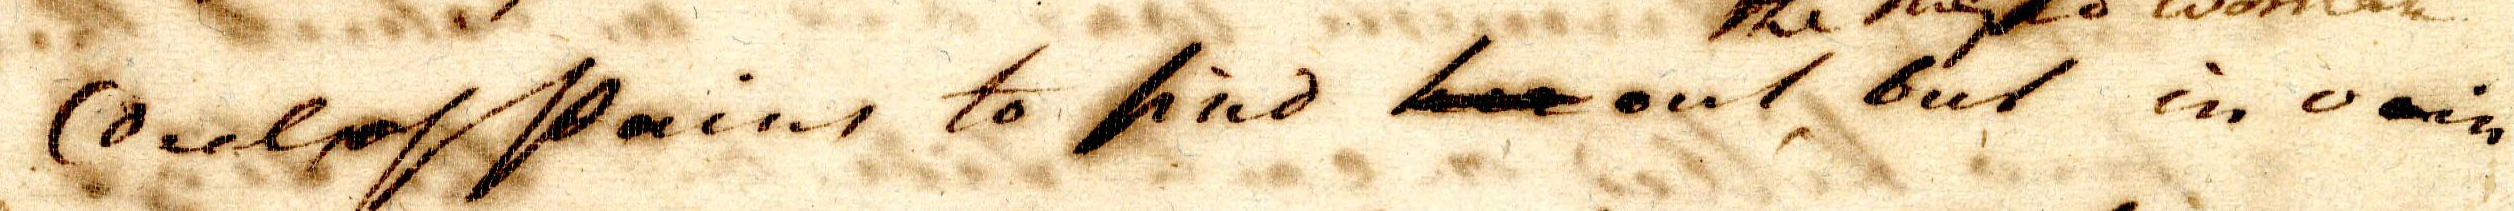Couel of pains to find her out ^ but in vain
